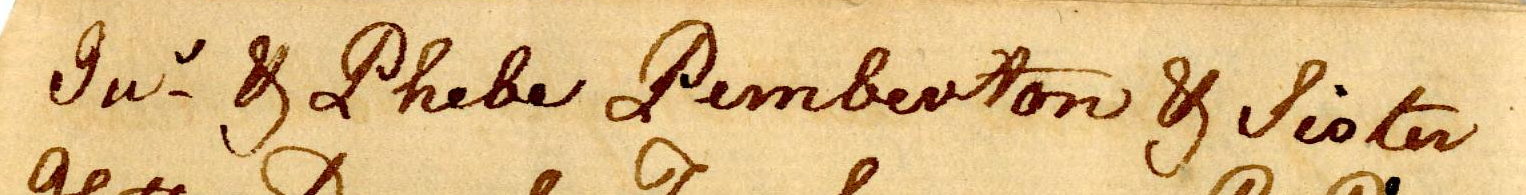Ju^s & Phebe Pemberton & Sister
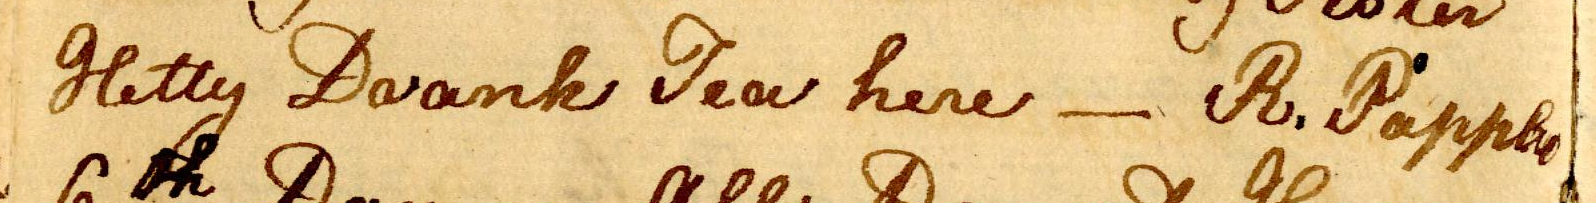Hetty Drank Tea here- R. Papphs
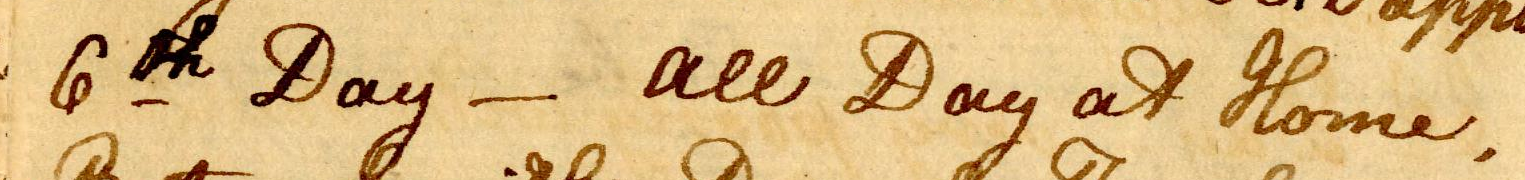6^th Day- All Day at Home,
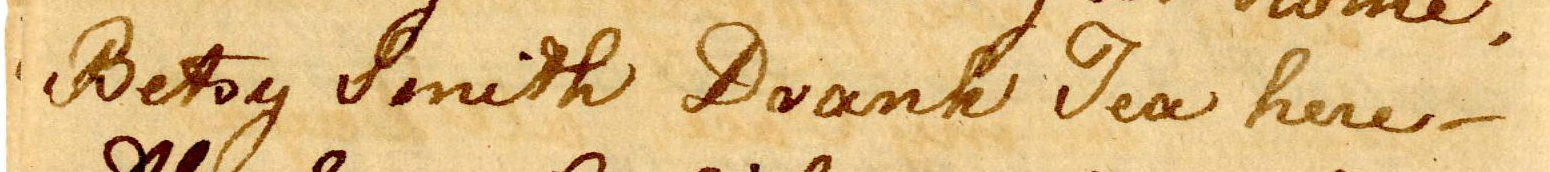Betsy Smith Drank Tea here-
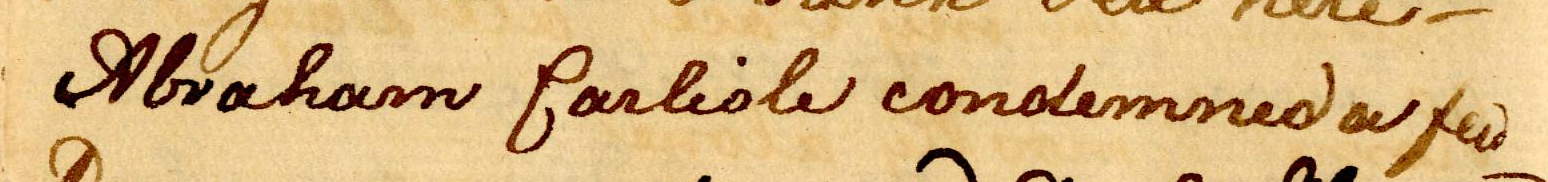Abraham Carlisle condemned a few
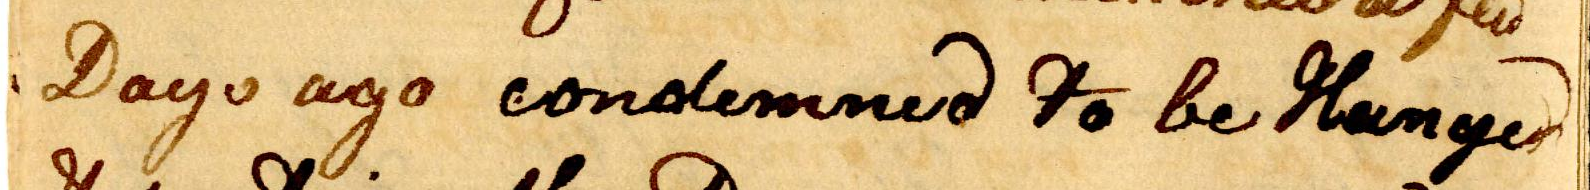Days ago condemned to be Hanged
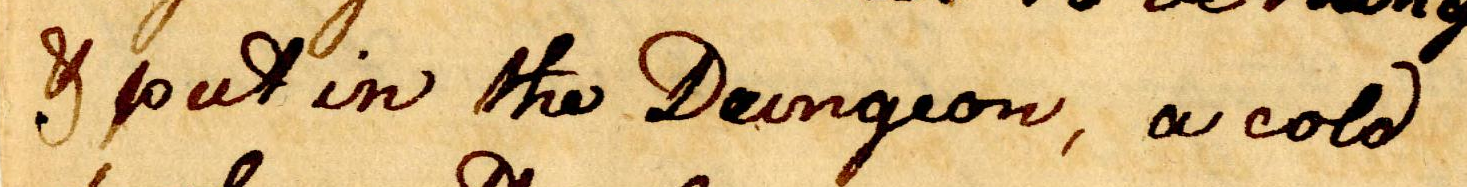& put in the Dungeon, a cold
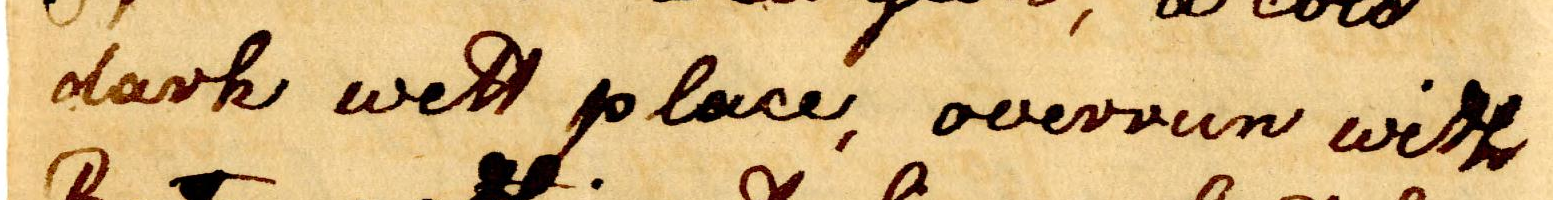dark wett place, overrun with
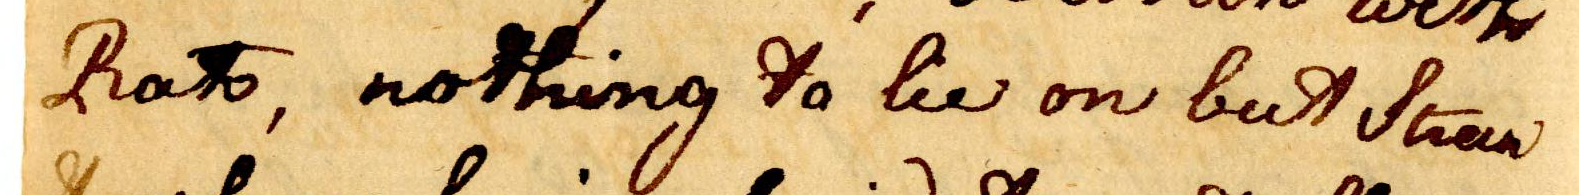Rats, nothing to lie on but Straw
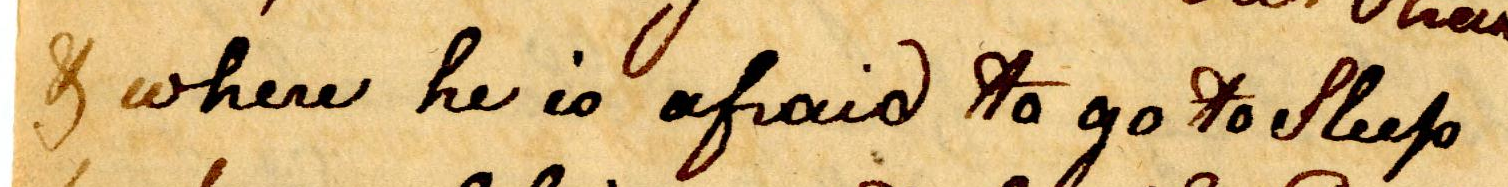& where he is afraid to go to Sleep
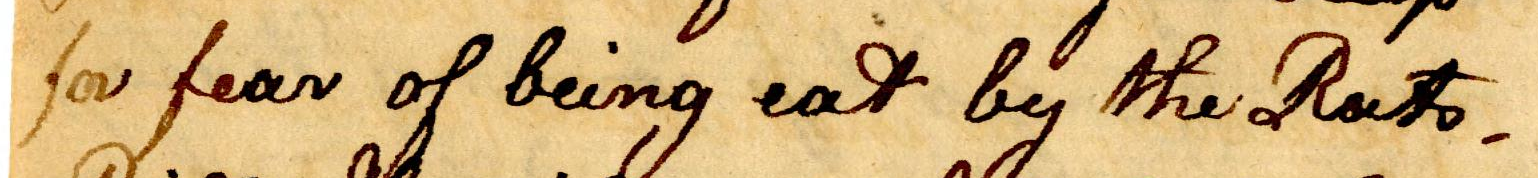for fear of being eat by the Rats,
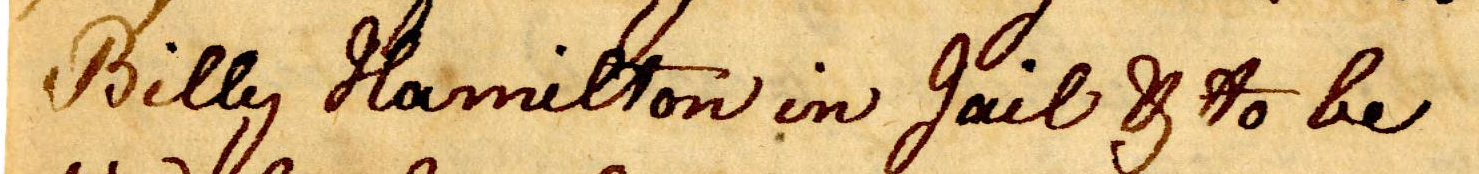Billy Hamilton in Jail & to be
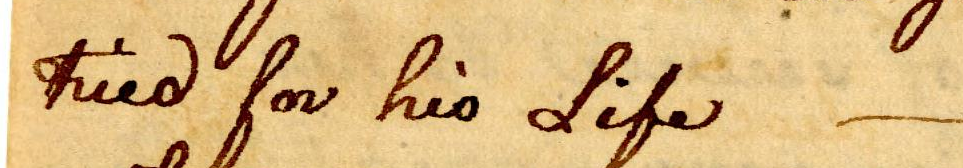tried for his Life-
